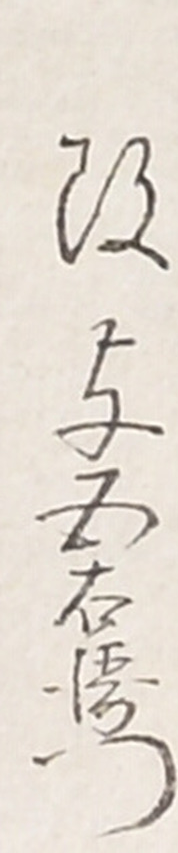改与五右衛門
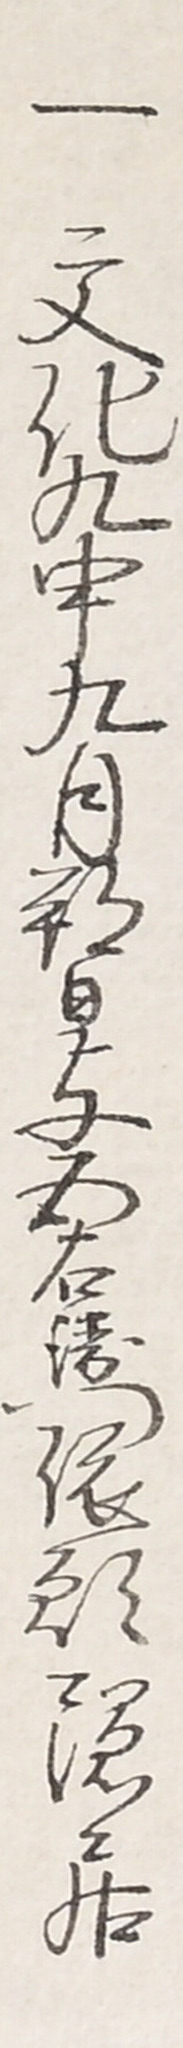一文化九申九月朔日与五右衛門依願隠居
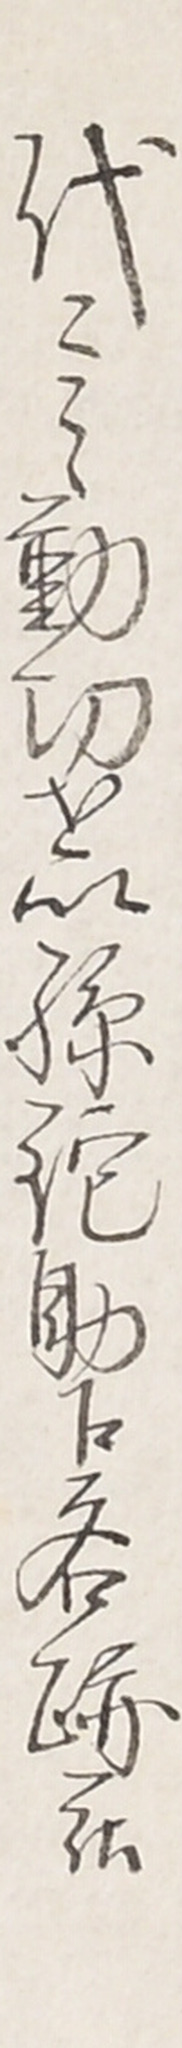代々之勤功を以孫鉈助江名跡被
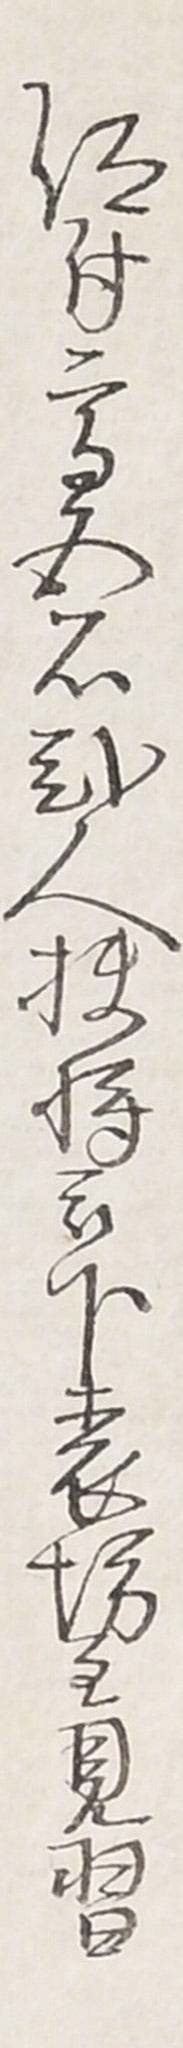仰付高五石弐人扶持被下表坊主見習
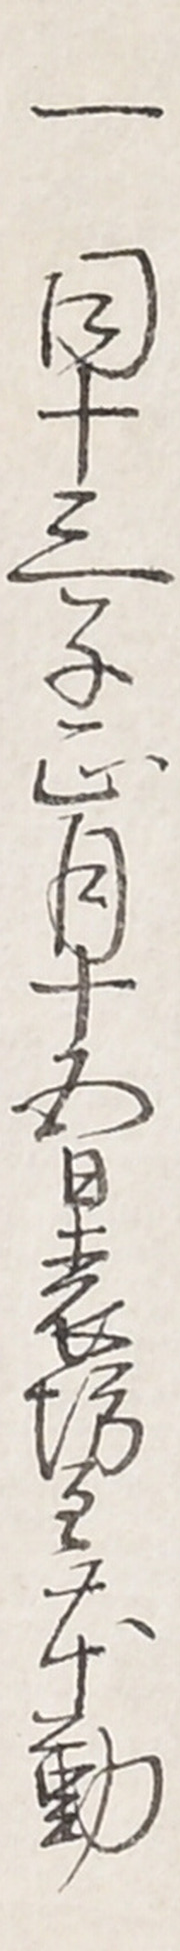一同十三子正月十五日表坊主本勤
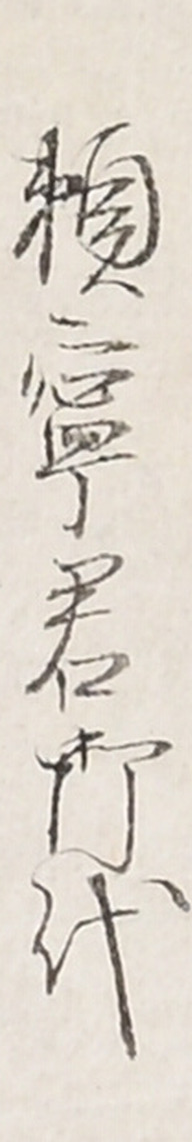頼寧君御代
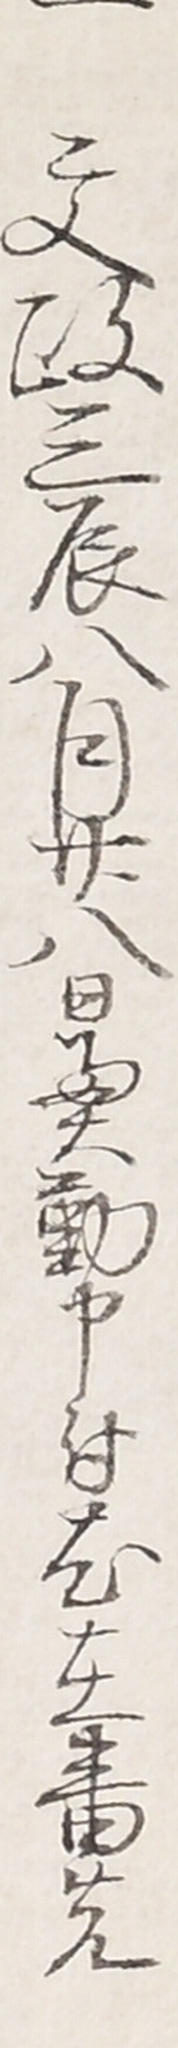一文政三辰八月廿八奥勤申付尤在番先
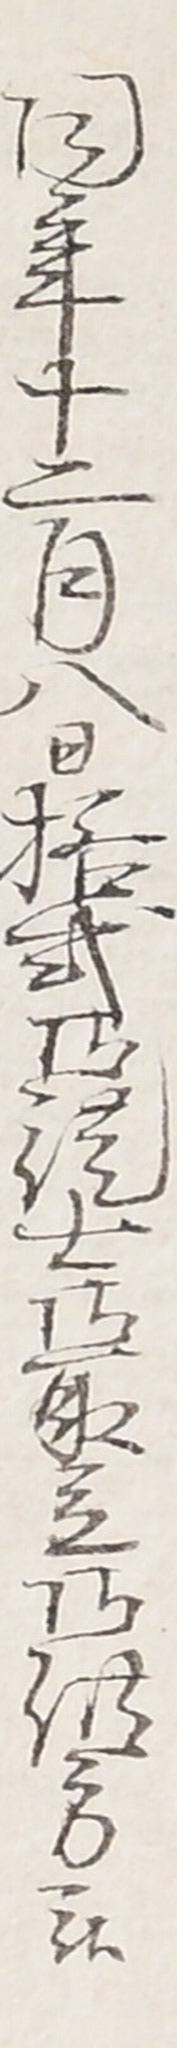一同年十二月八日格式御徒士御取立御供方被
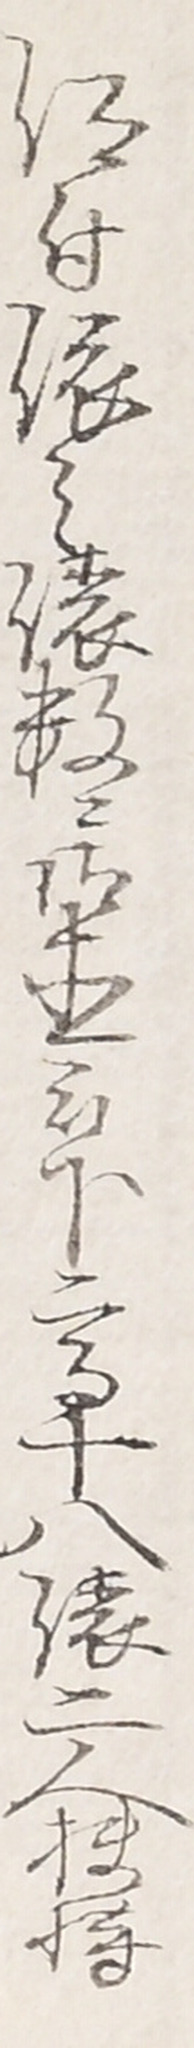仰付依之俵数ニ御直被下高十八俵二人扶持
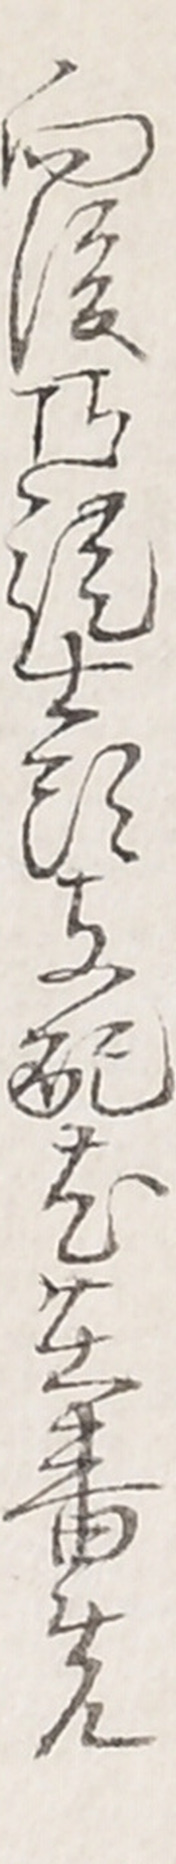向後御徒士頭支配尤在番先
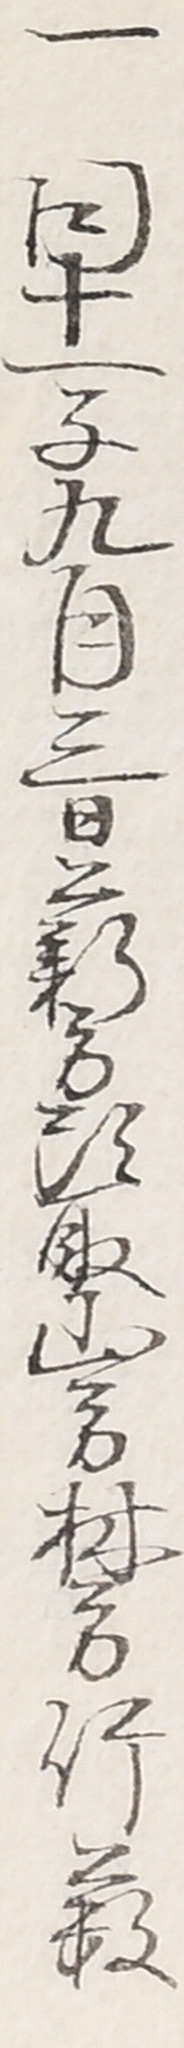一同十一子九月三日薪方頭取山方林方竹藪
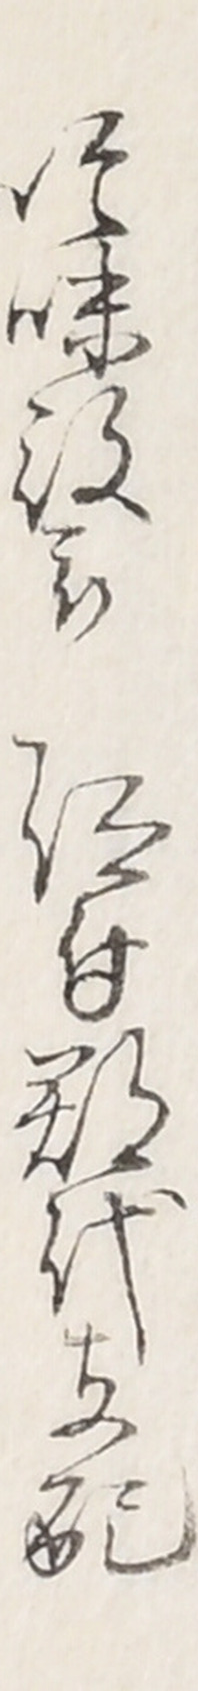吟味役被仰付郡代支配
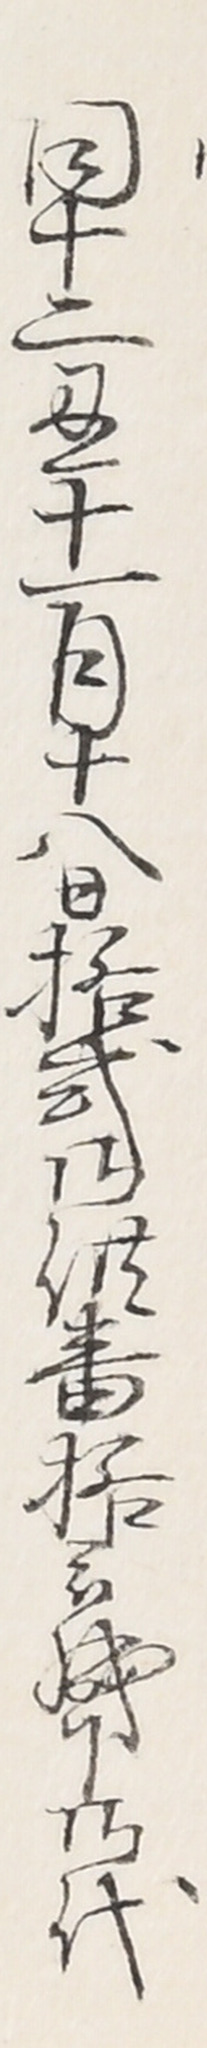一同十二丑十一月十八日格式御供番格被成下御代
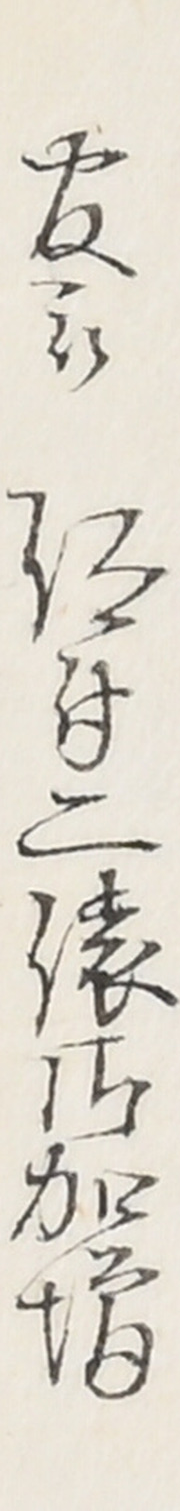官被仰付二俵御加増
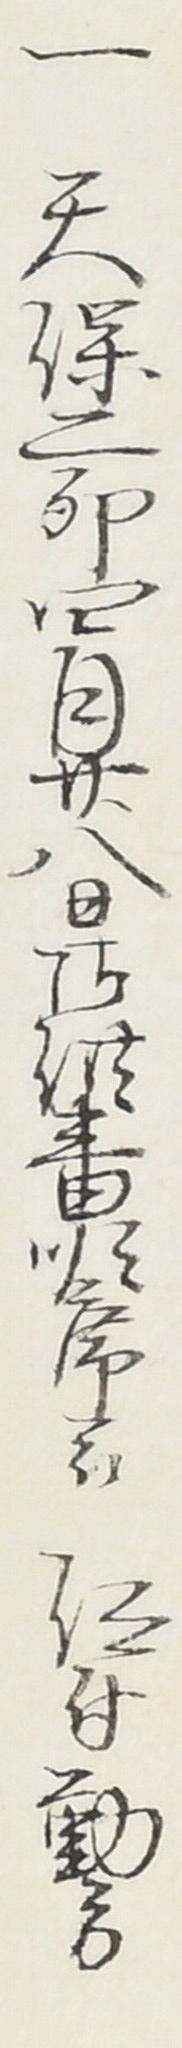一天保二卯四月廿八日御供番順席被仰付勤方
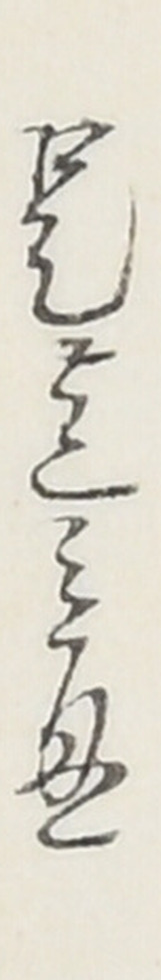是迄之通
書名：無足諸士勤仕録（四）
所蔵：伊那市立高遠町図書館・合同会社AMANE
